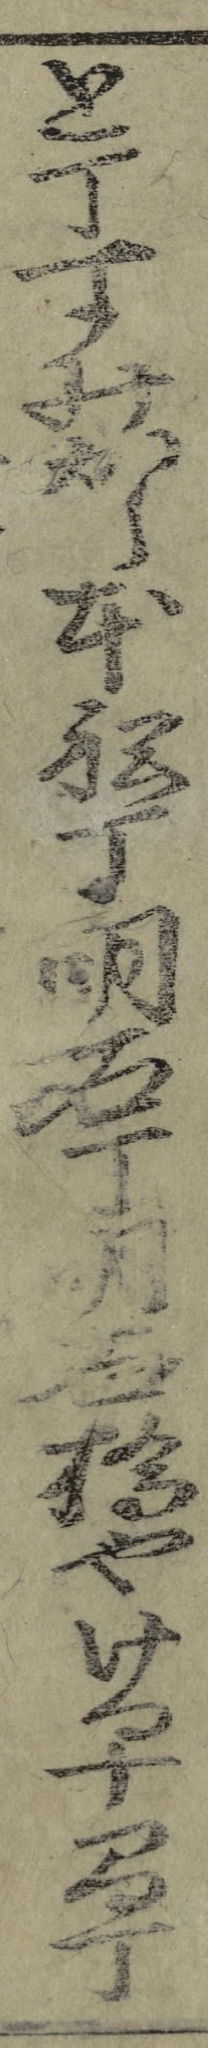と丁すみから本船丁明石丁明石橋やける十間丁
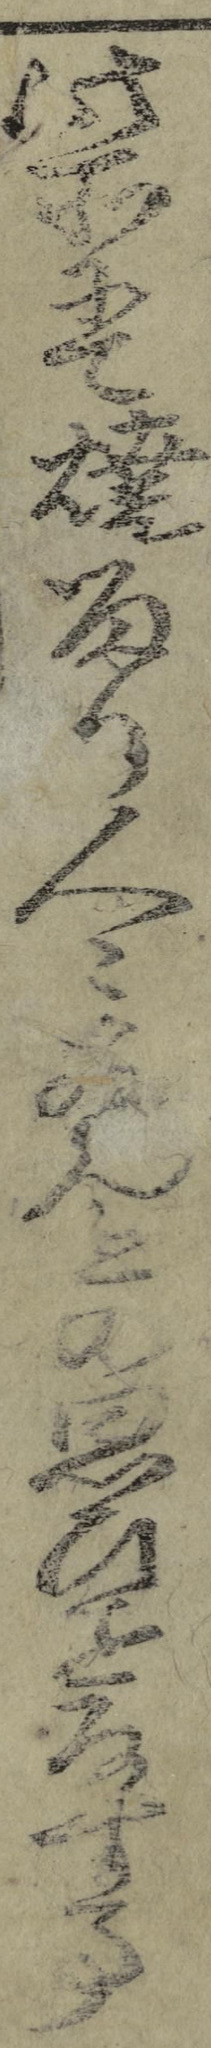此所にて焼留り人〻あんとの思ひとなす事
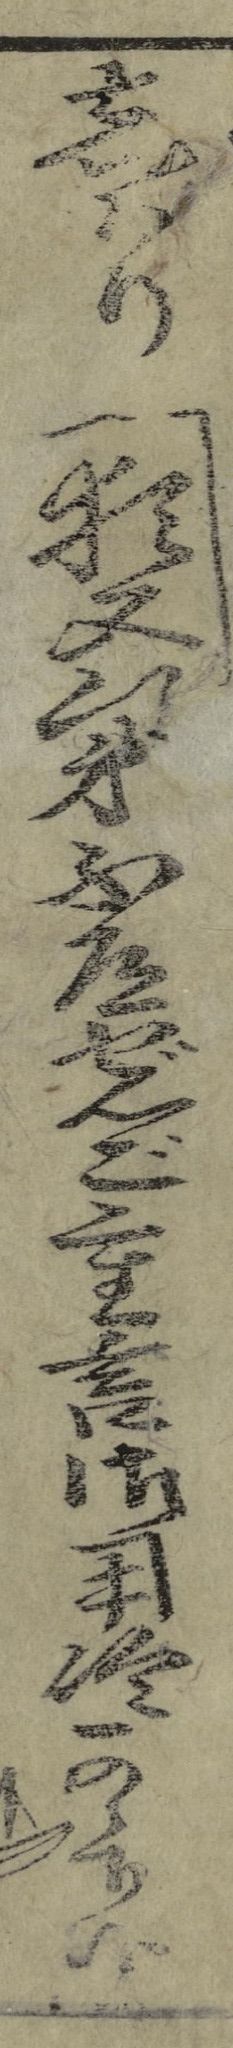しかり〽猶又次第不道ぜんご重言御用終可下候
